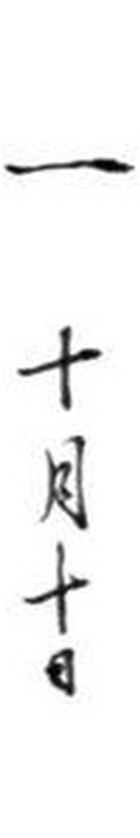一十月十日
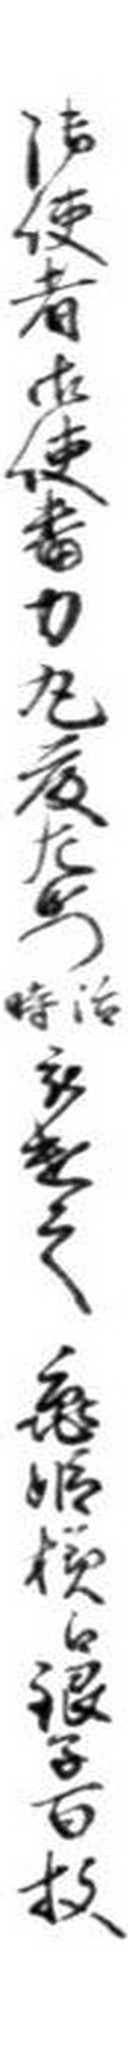御使者御使番力丸藤左衛門治時被遣之亀姫様江銀子百枚
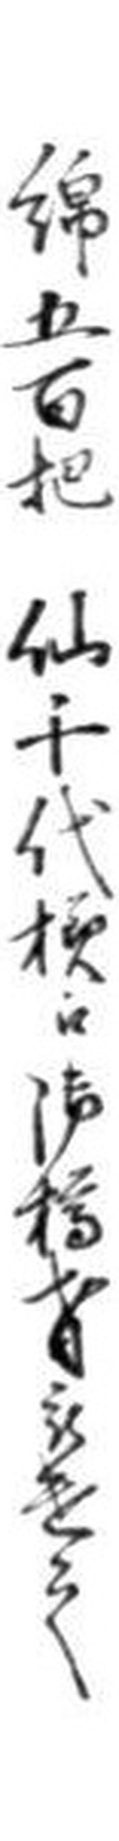綿五百把仙千代様江御樽肴被遣之
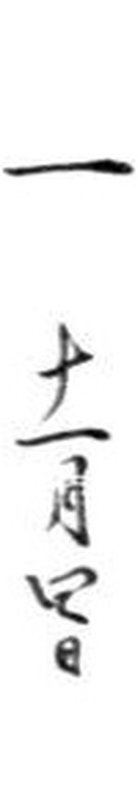一十一月四日
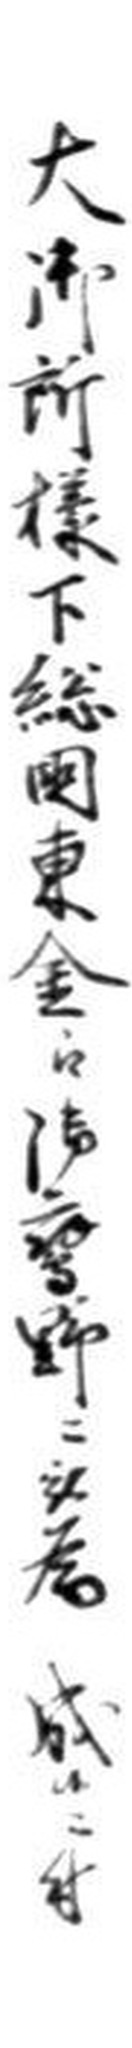大御所様下総国東金江御鷹野ニ被為成候ニ付
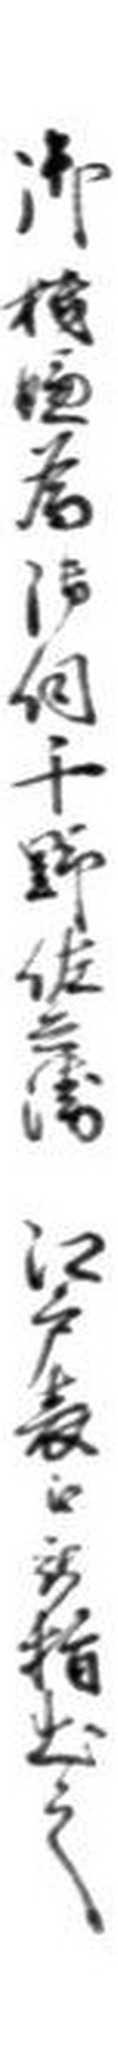御機嫌為御伺千野佐兵衛江戸表江被指出之
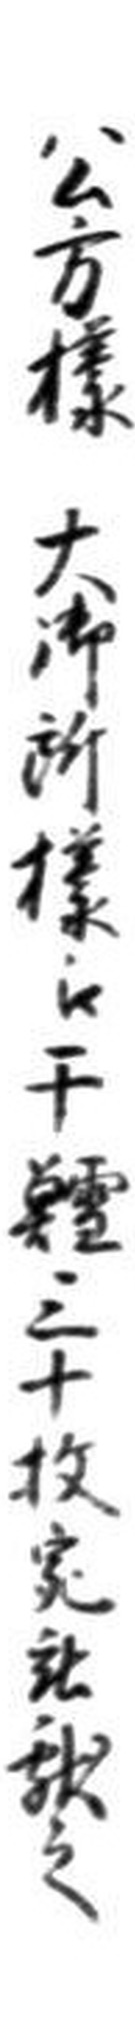公方様大御所様江干鱈三十枚宛被献之
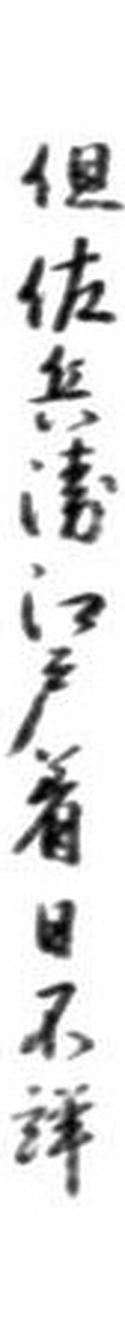但佐兵衛江戸着日不詳
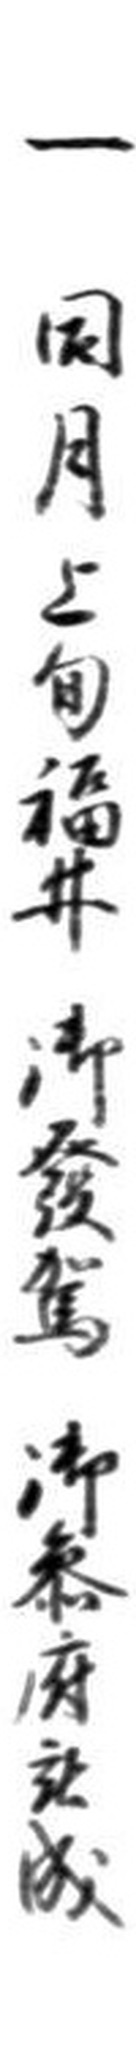一同月上旬福井御発駕御参府被成
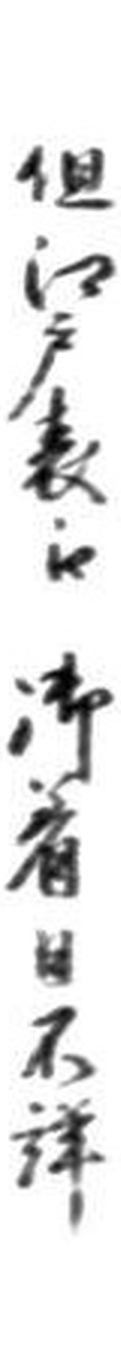但江戸表江御着日不詳
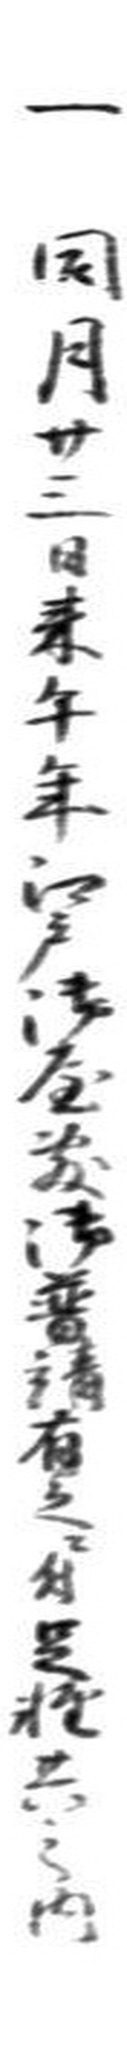一同月廿三日来午年江戸御屋敷御普請有之ニ付足軽共之内
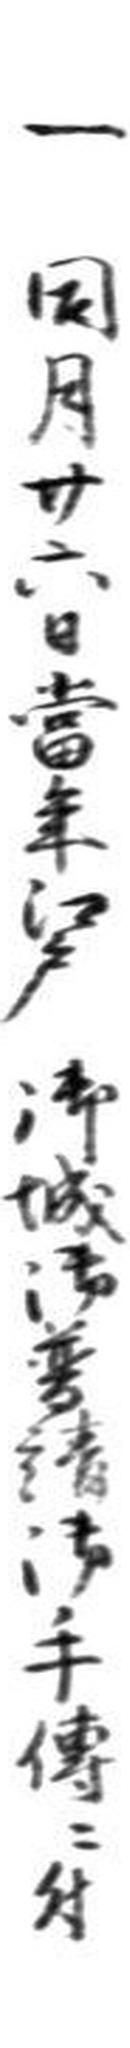一同月廿六日当年江戸御城御普請御手伝ニ付
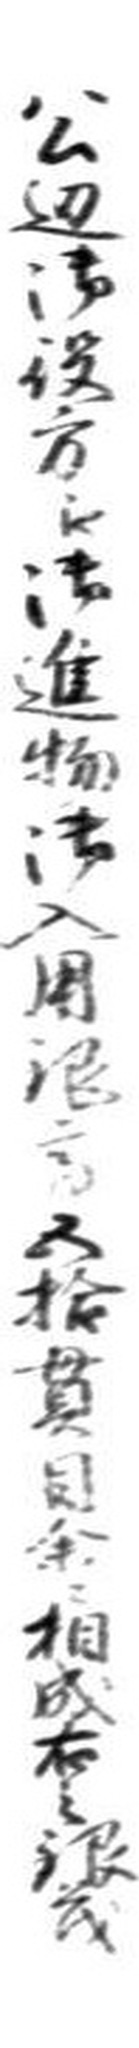公辺御役方江御進物御入用銀高五拾貫目余ニ相成右之銀も
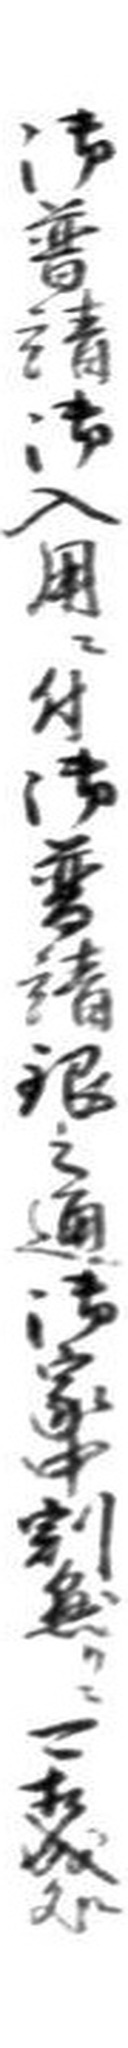御普請御入用ニ付御普請銀之通御家中割懸りニ可相成処

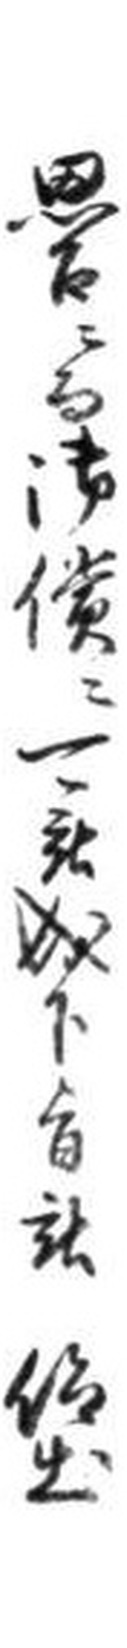思召ニ而御償ニ可被成下旨被仰出
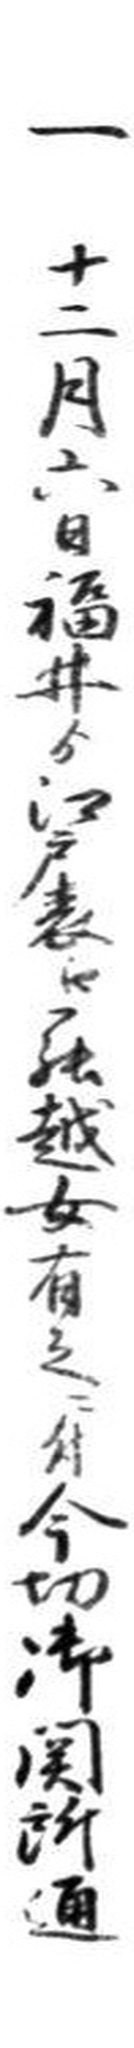一十二月六日福井ゟ江戸表江罷越女有之ニ付今切御関所通
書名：家譜 三 忠昌公 従慶長八年到寛永六年
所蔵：福井県文書館 Fukui Prefectural Archives
